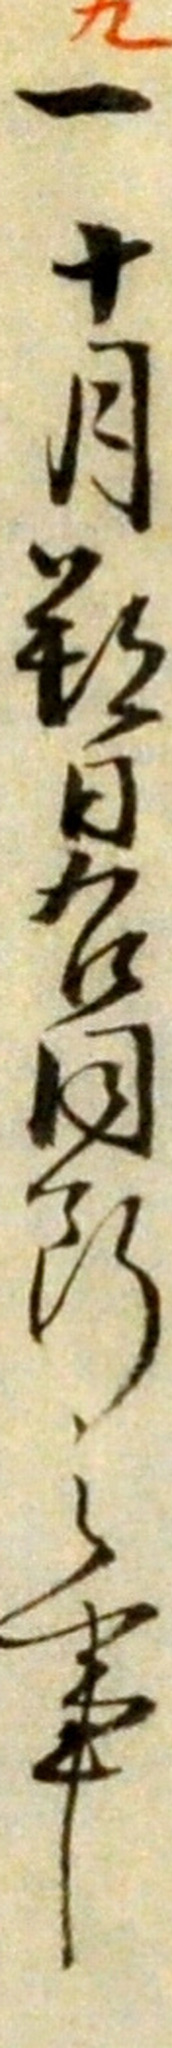一十月朔日右同断之事
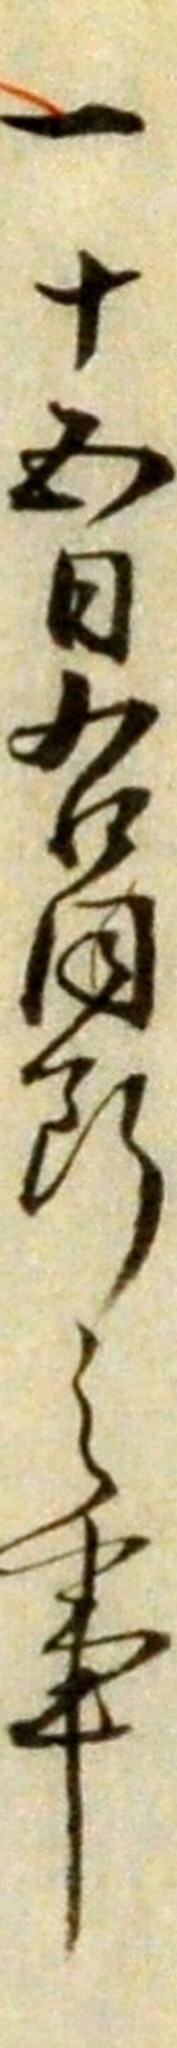一十五日右同断之事
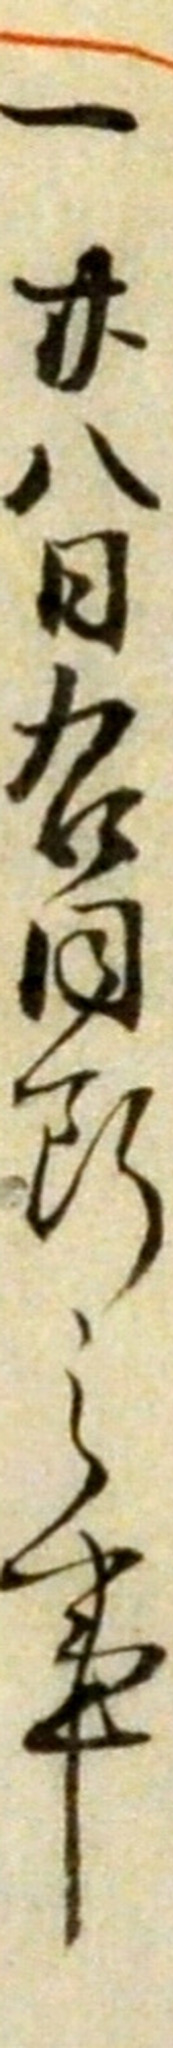一廿八日右同断之事
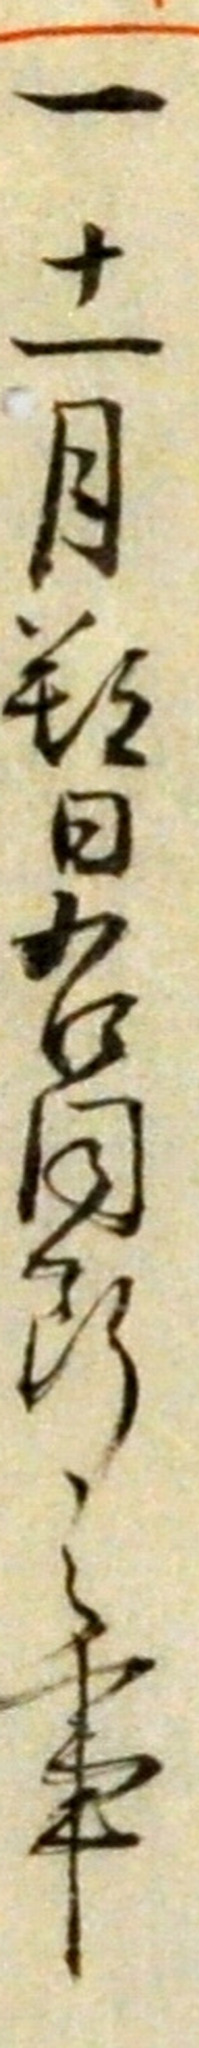一十一月朔日右同断之事
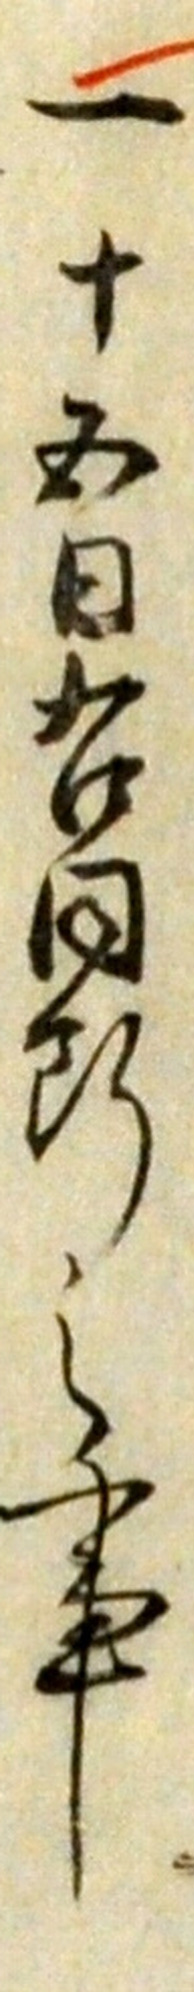一十五日右同断之事
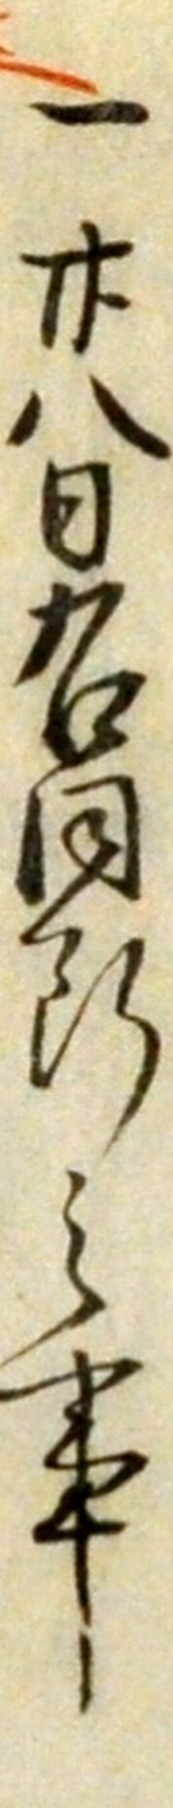一廿八日右同断之事
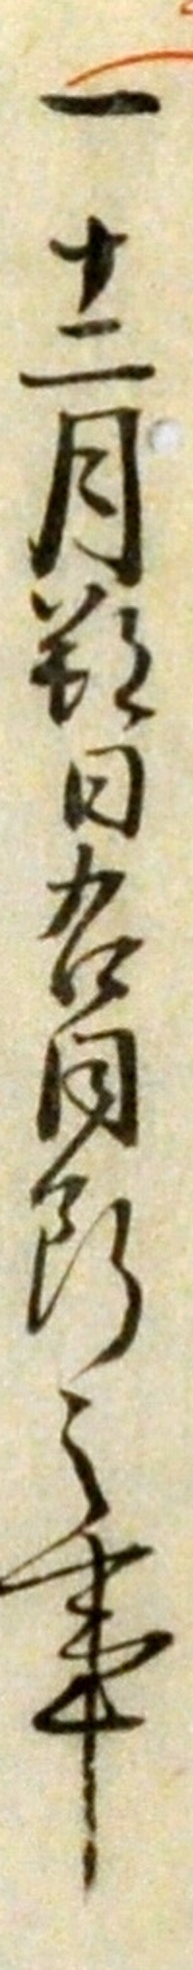一十二月朔日右同断之事
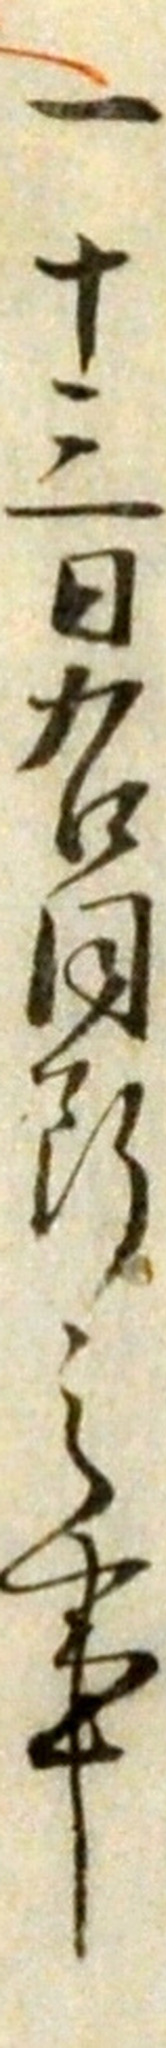一十三日右同断之事
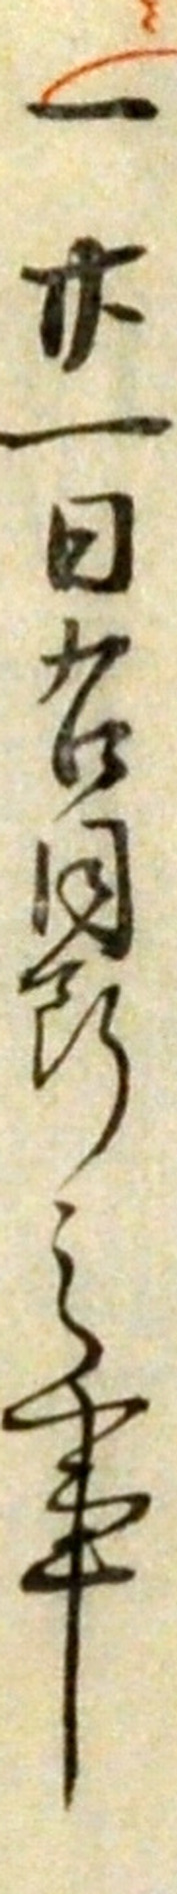一廿一日右同断之事
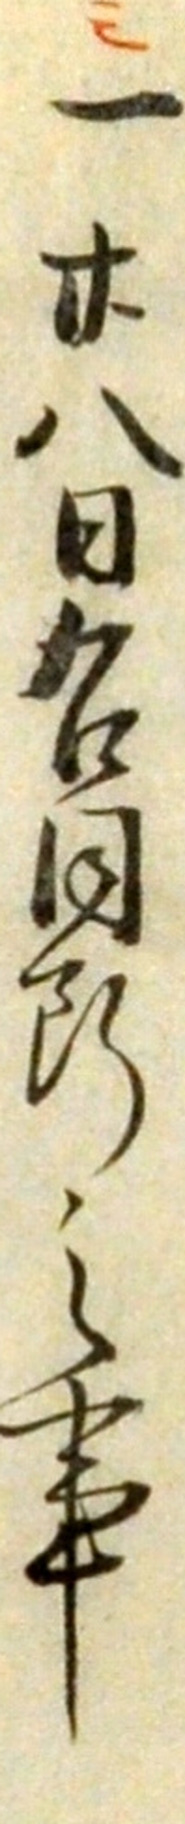一廿八日右同断之事
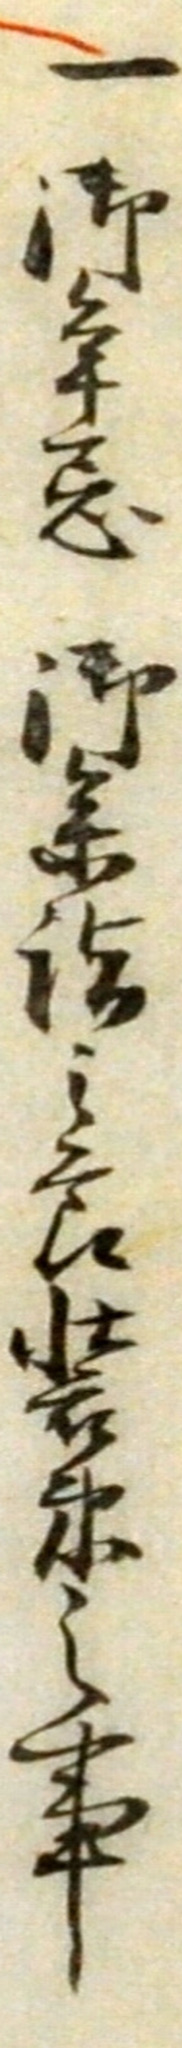一御年忌御参詣之節之事
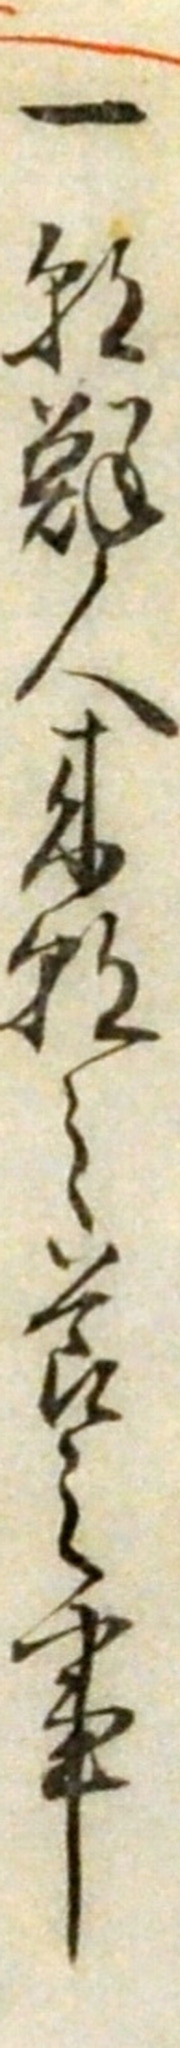一朝鮮人来朝之節之事
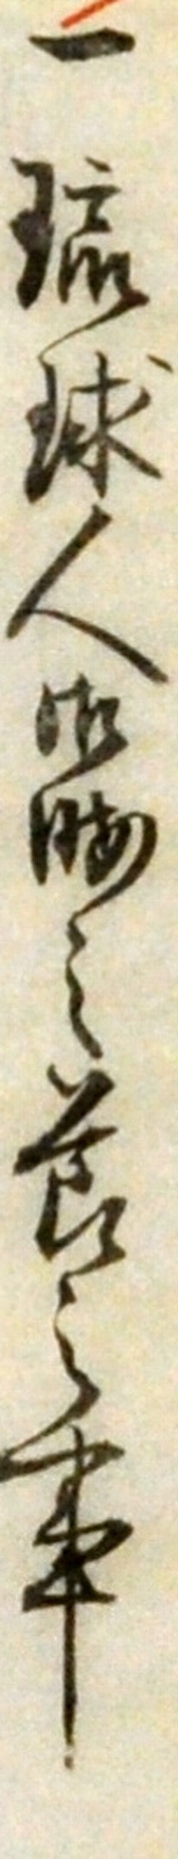一琉球人御暇之節之事
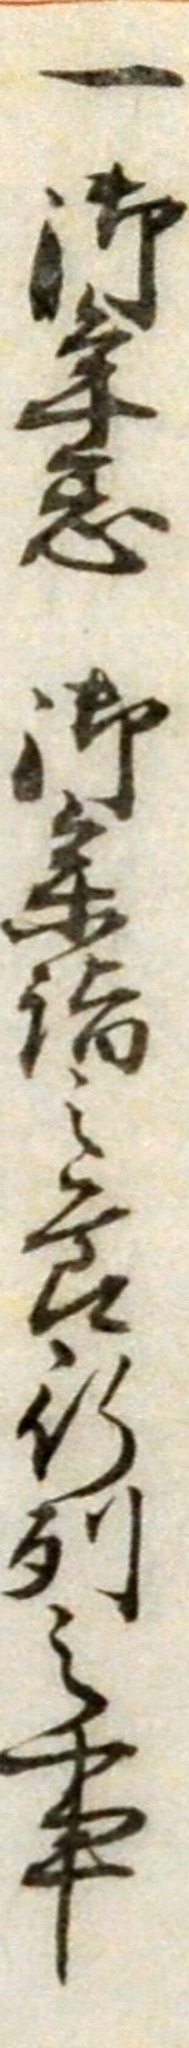一御年忌御参詣之節之事

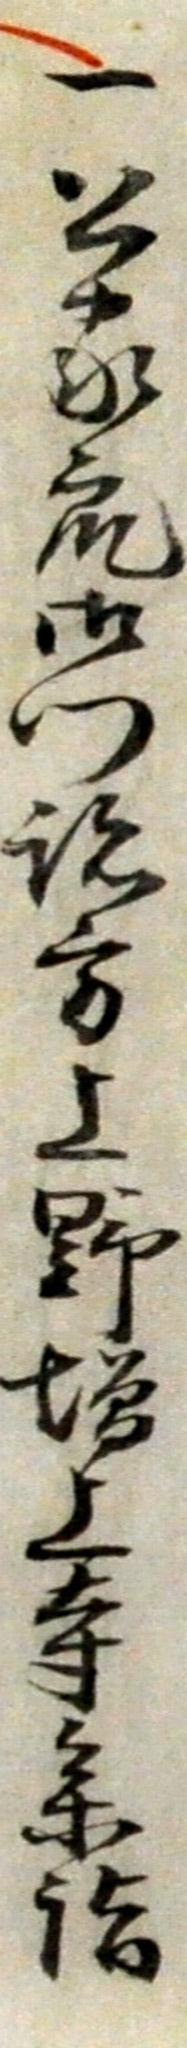一公家衆御門跡方上野増上寺参詣
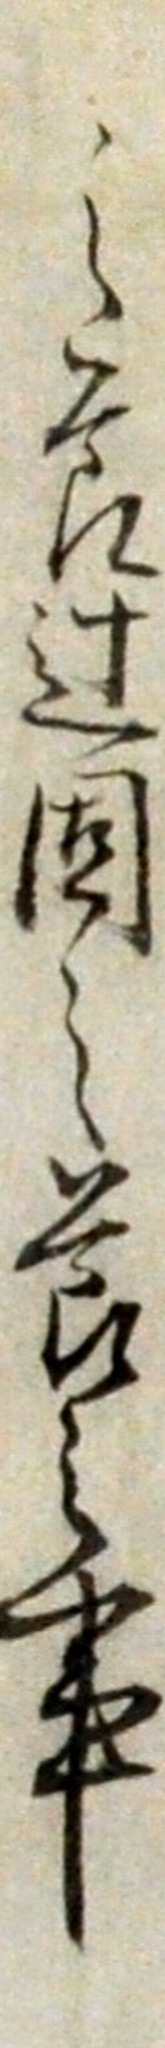之節辻固之節之事
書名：申合帳〔一括〕
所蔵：伊那市立高遠町図書館・合同会社AMANE
